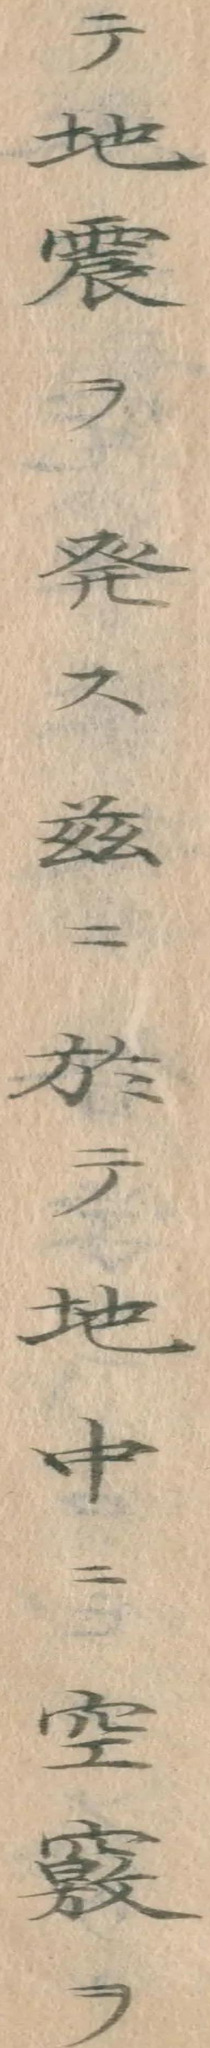テ地震ヲ発ス茲ニ於テ地中ニ空竅ヲ
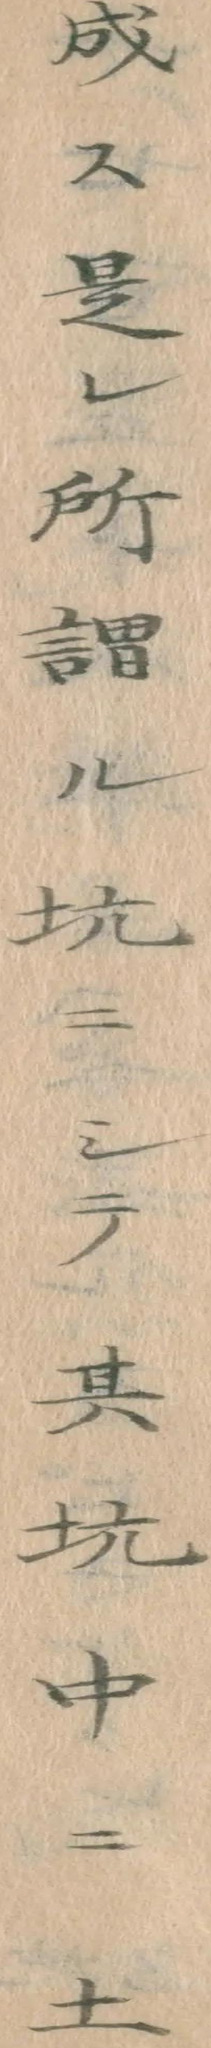成ス是レ所謂ル坑ニシテ其坑中ニ土
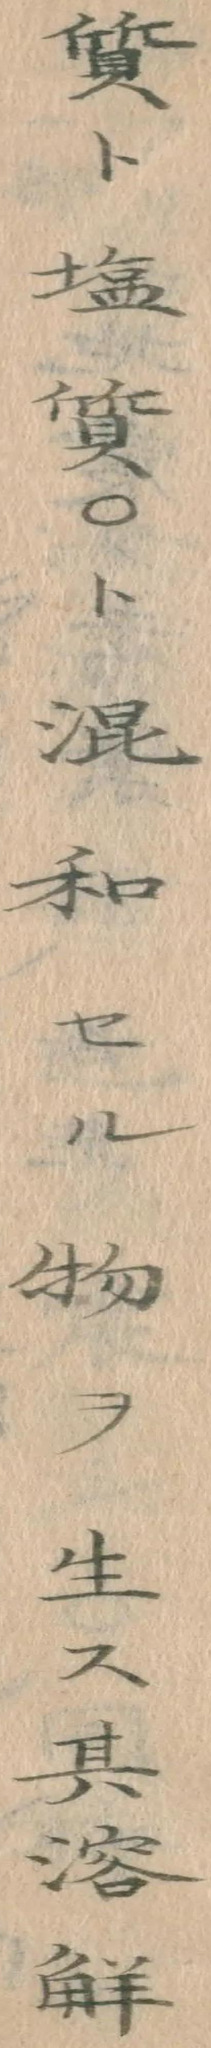質ト塩質○ト混和セル物ヲ生ス其溶解
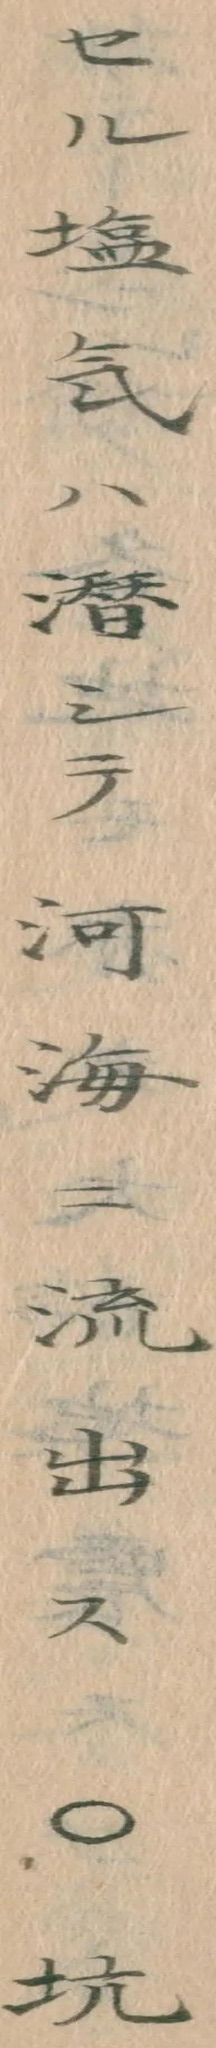セル塩ハ潜シテ河海ニ流出ス○坑
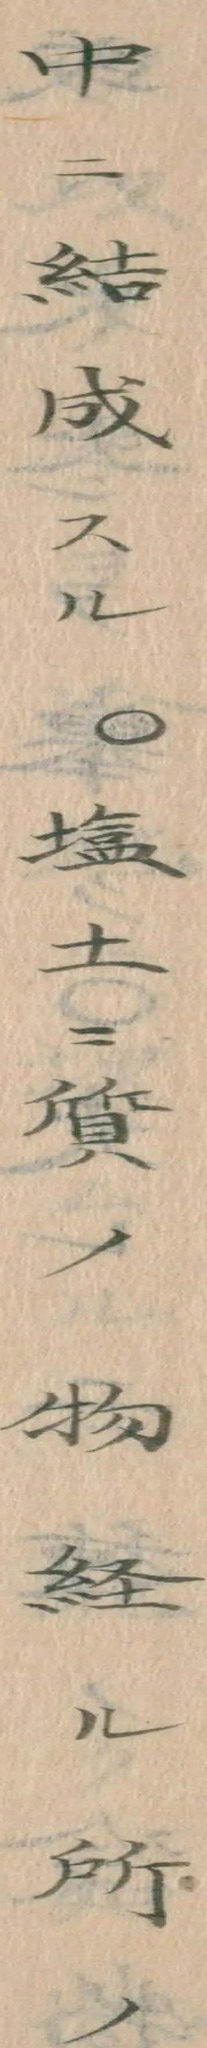中ニ結成スル○塩土二質ノ物経ル所ノ
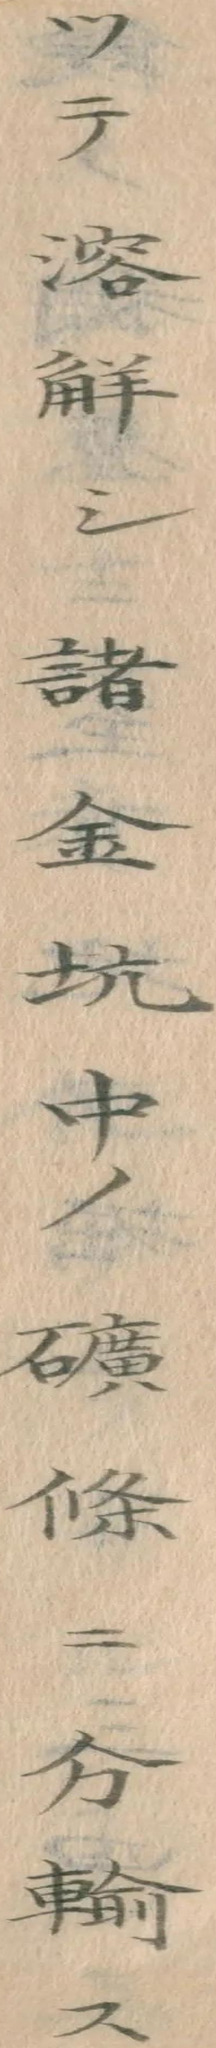ツテ溶解シ諸金坑中ノ砿条ニ分輸ス
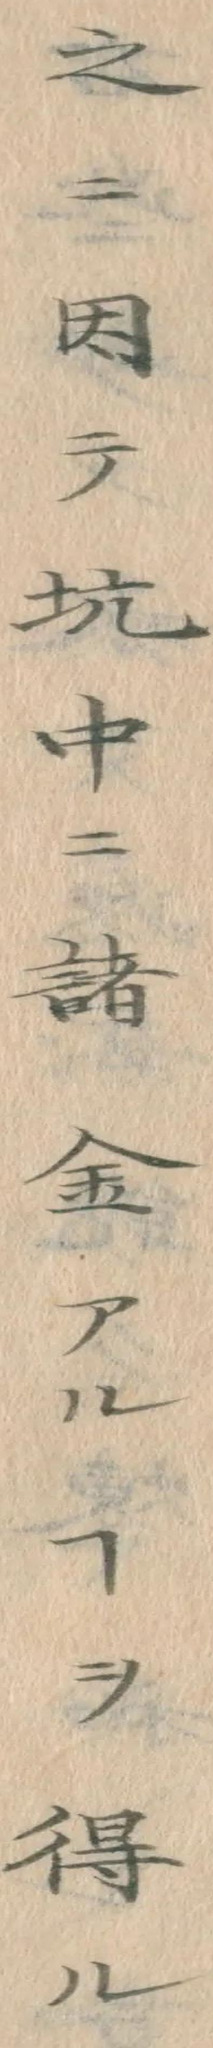之ニ因テ坑中ニ諸金アル事ヲ得ル
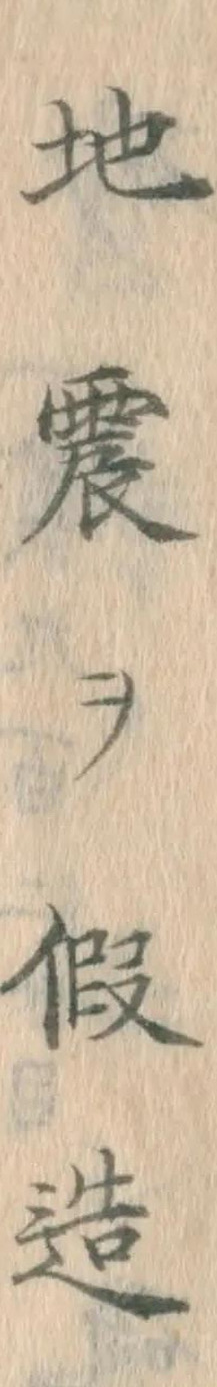地震ヲ仮造
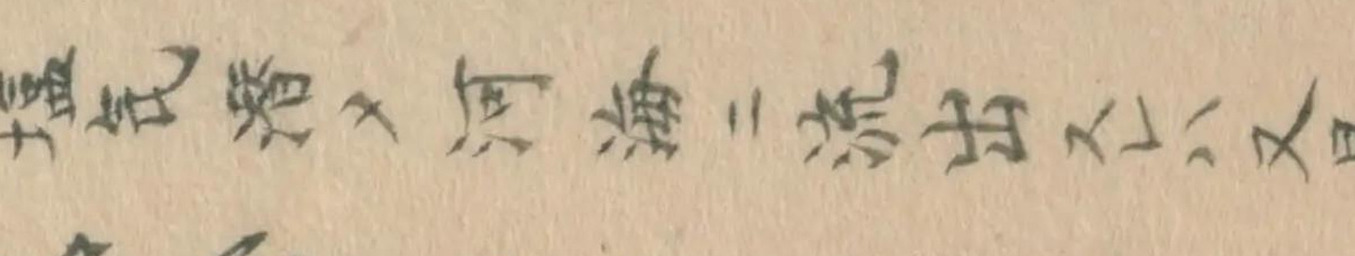セル塩ハ潜シテ河海ニ流出ス○坑
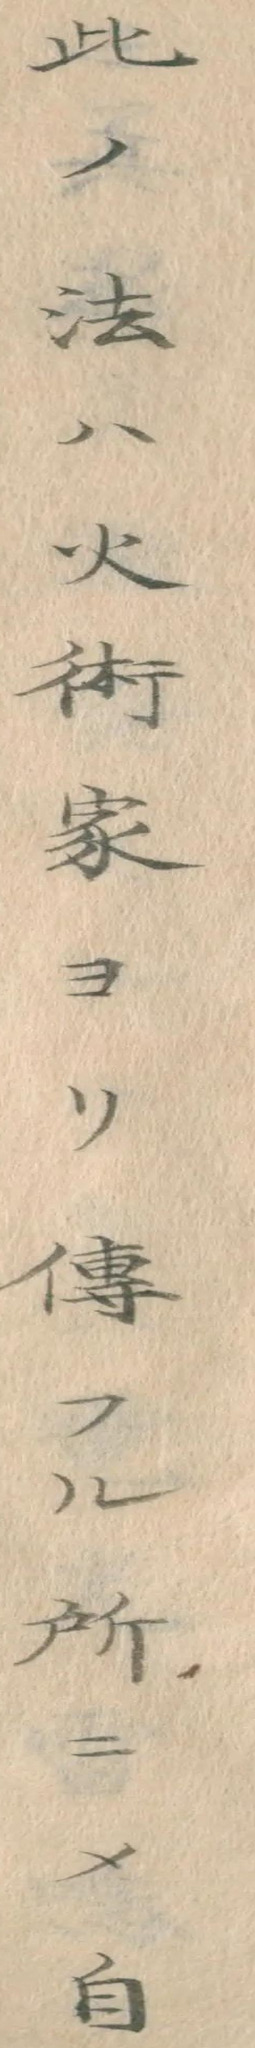此ノ法ハ火術家ヨリ伝フル所ニメ自
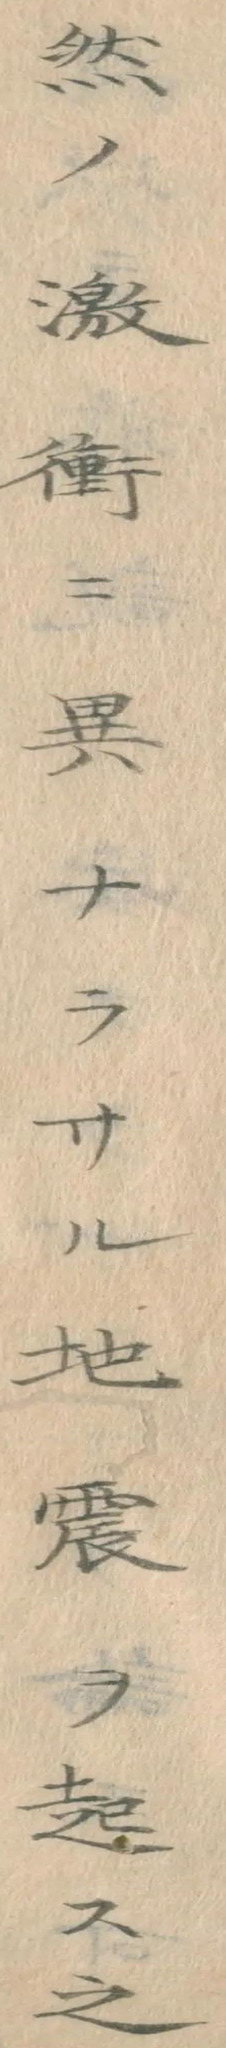然ノ激衝ニ異ナラサル地震ヲ起ス之

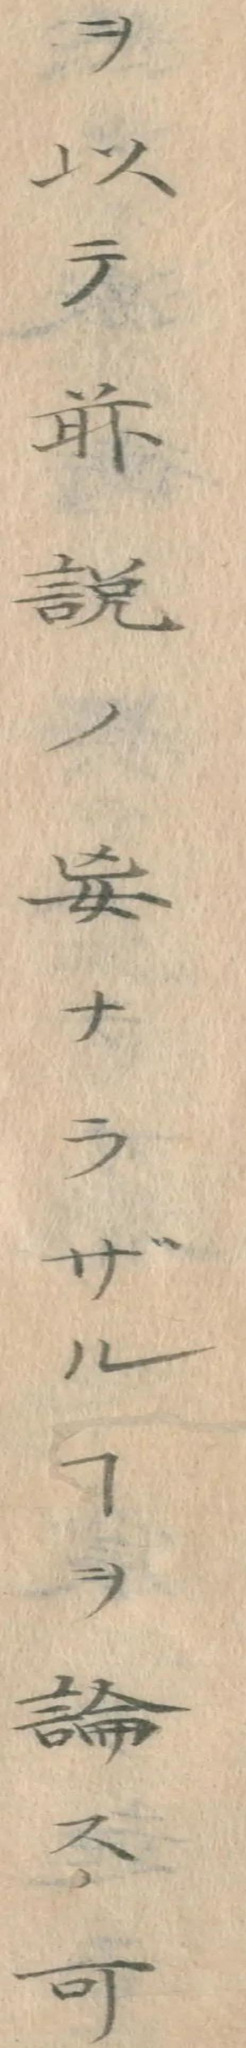ヲ以テ前説ノ妄ナラザル事ヲ論ス可
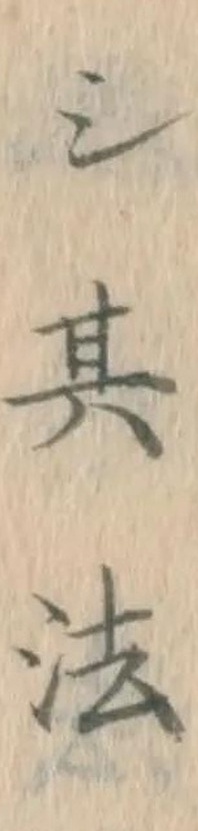シ其法
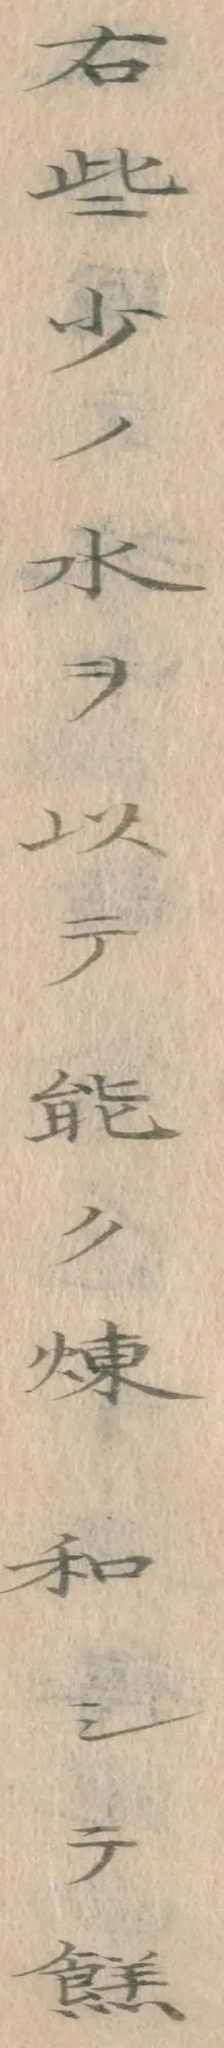右些少ノ水ヲ以テ能ク煉和シテ餻
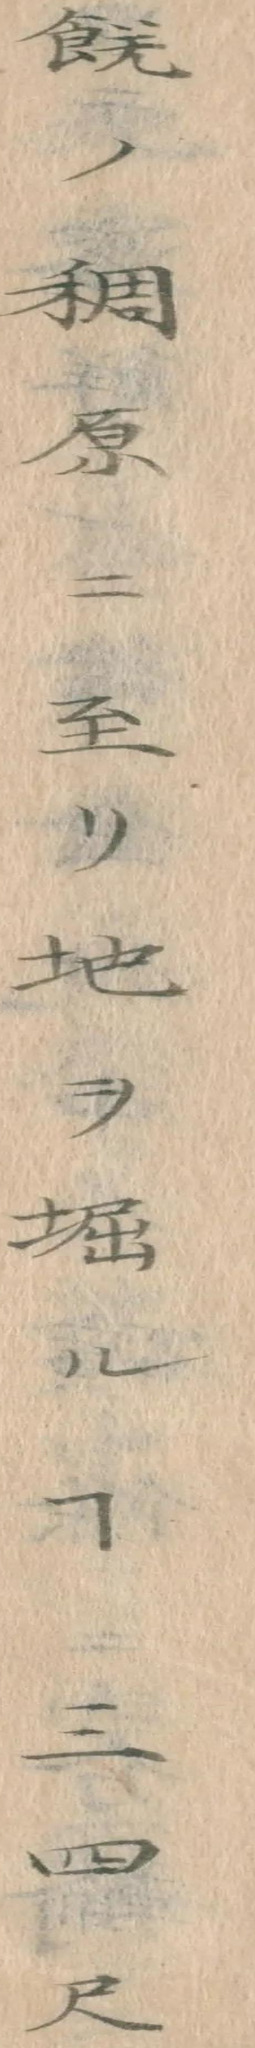ノ稠原ニ至リ地ヲ掘ル事三四尺
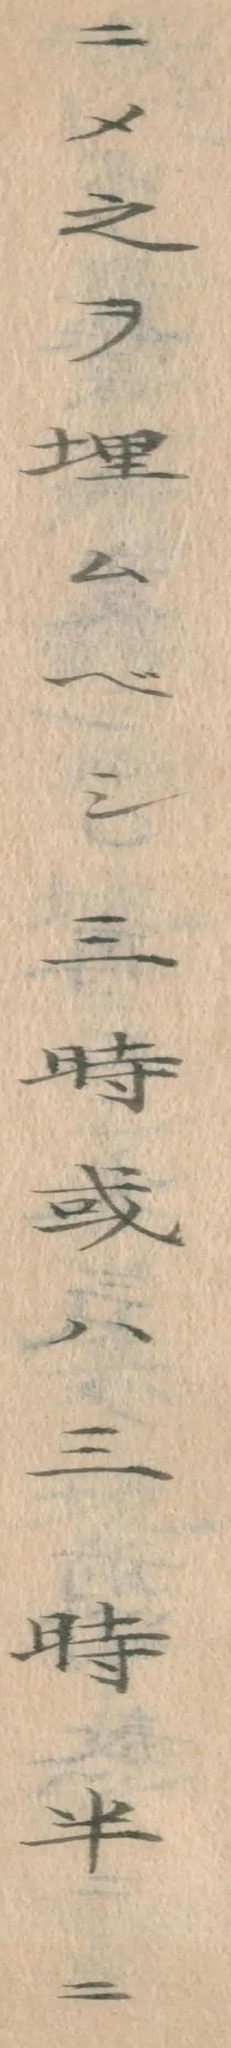ニメ之ヲ埋ムベシ三時或ハ三時半ニ
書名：輪池叢書. 12
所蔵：国立国会図書館 National Diet Library, JAPAN
